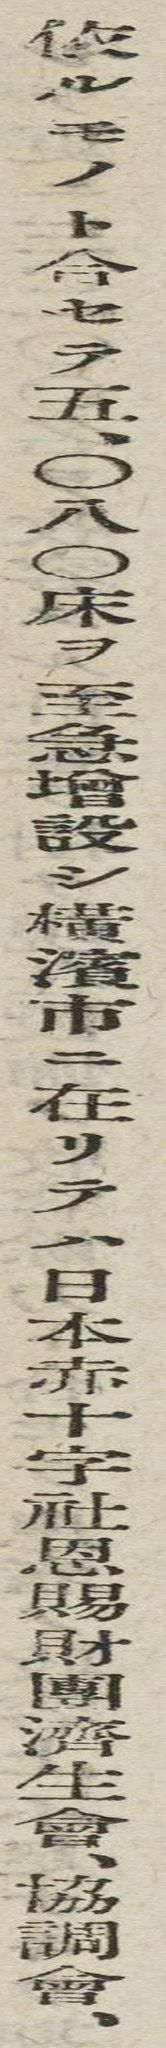依ルモノト合セテ五、〇八〇床ヲ至急増設シ横浜市ニ在リテハ日本赤十字社恩賜財団済生会、協調会、
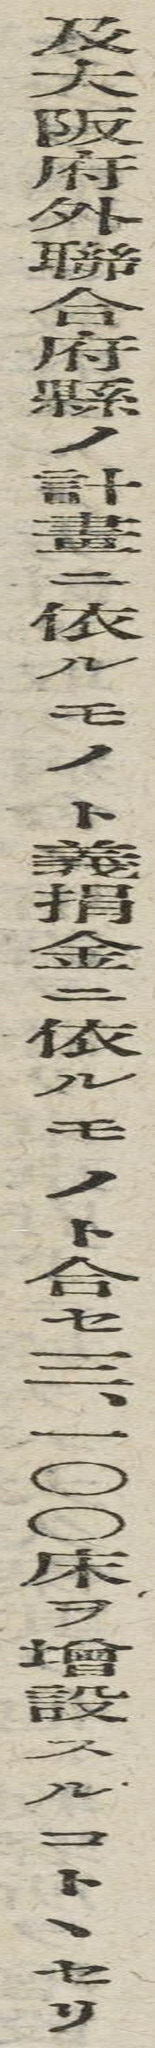及大阪府外連合府県ノ計画ニ依ルモノト義捐金ニ依ルモノト合セ三、一〇〇床ヲ増設スルコトヽセリ
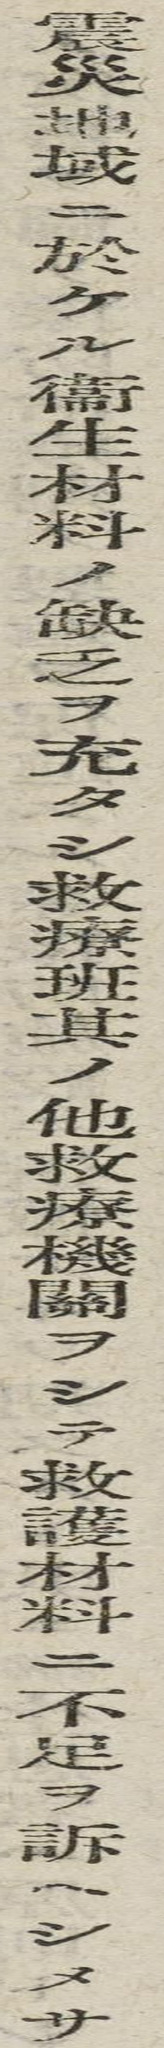震災地域ニ於ケル衛生材料ノ欠乏ヲ充タシ救療班其ノ他救療機関ヲシテ救護材料ニ不足ヲ訴ヘシメサ
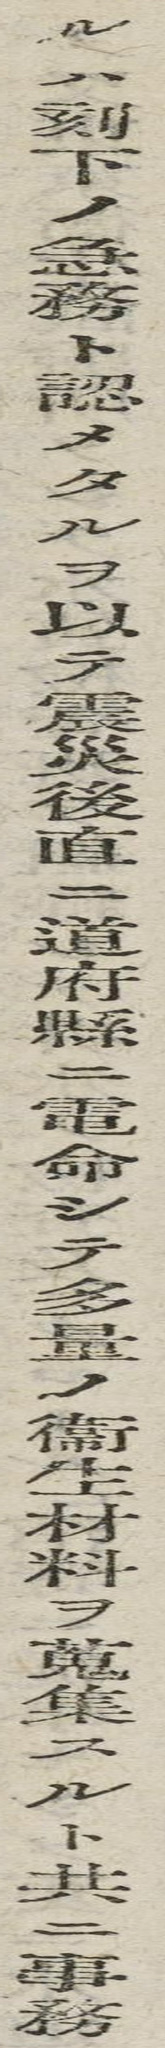ルハ刻下ノ急務ト認メタルヲ以テ震災後直ニ道府県ニ電命シテ多量ノ衛生材料ヲ蒐集スルト共ニ事務
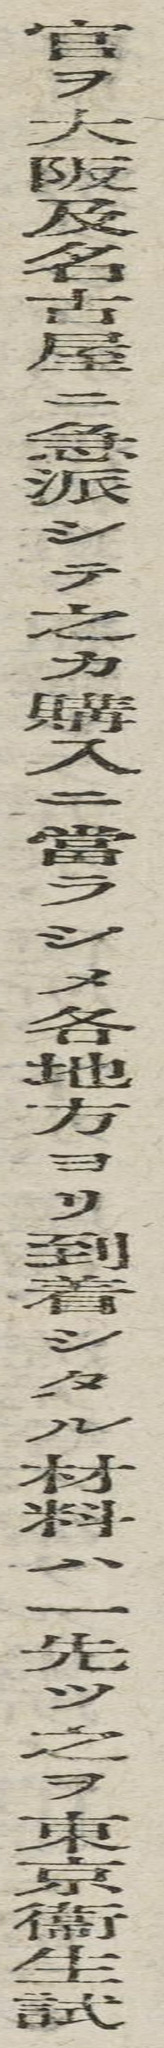官ヲ大阪及名古屋ニ急派シテ之カ購入ニ当ラシメ各地方ヨリ到着シタル材料ハ一先ツ之ヲ東京衛生試
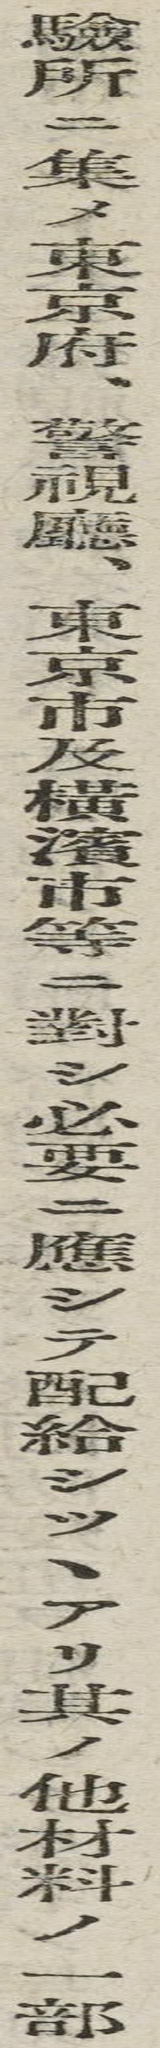験所ニ集メ東京府、警視庁、東京市及横浜市等ニ対シ必要ニ応シテ配給シツヽアリ其ノ他材料ノ一部
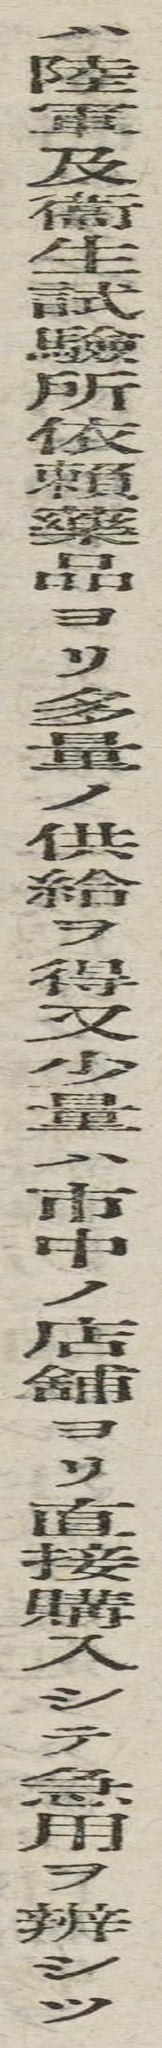ハ陸軍及衛生試験所依頼薬品ヨリ多量ノ供給ヲ得又少量ハ市中ノ店舗ヨリ直接購入シテ急用ヲ弁シツ
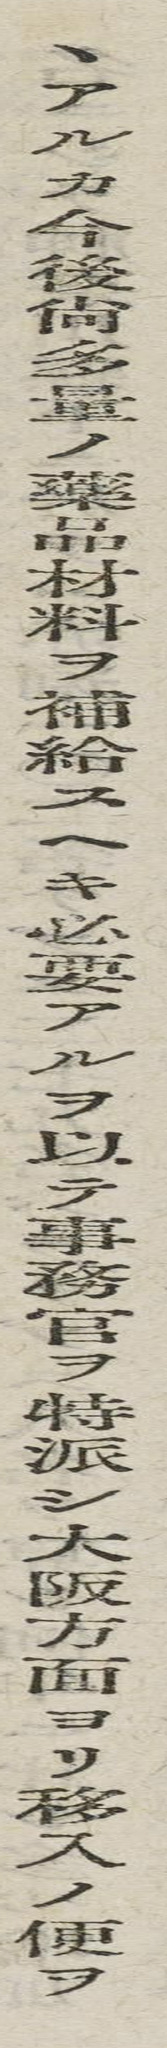ヽアルカ今後尚多量ノ薬品材料ヲ補給スヘキ必要アルヲ以テ事務官ヲ特派シ大阪方面ヨリ移入ノ便ヲ
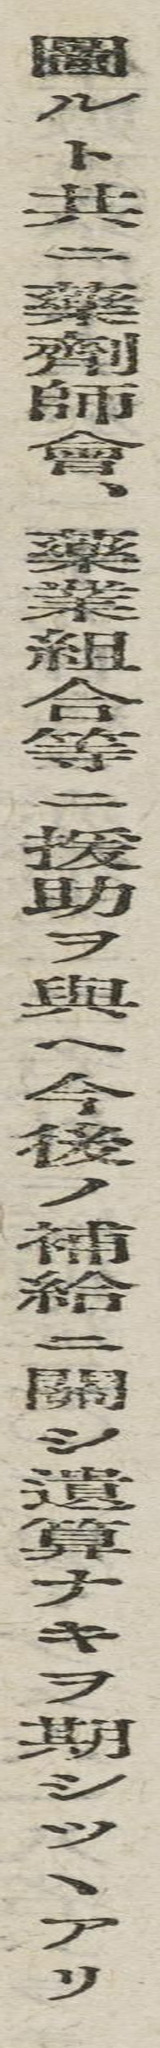図ルト共ニ薬剤師会、薬業組合等ニ援助ヲ与ヘ今後ノ補給ニ関シ遺算ナキヲ期シツヽアリ
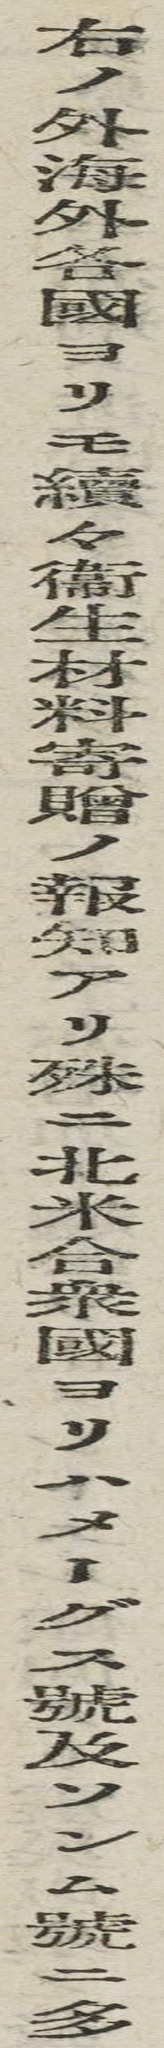右ノ外海外各国ヨリモ続々衛生材料寄贈ノ報知アリ殊ニ北米合衆国ヨリハメーグス号及ソンム号ニ多
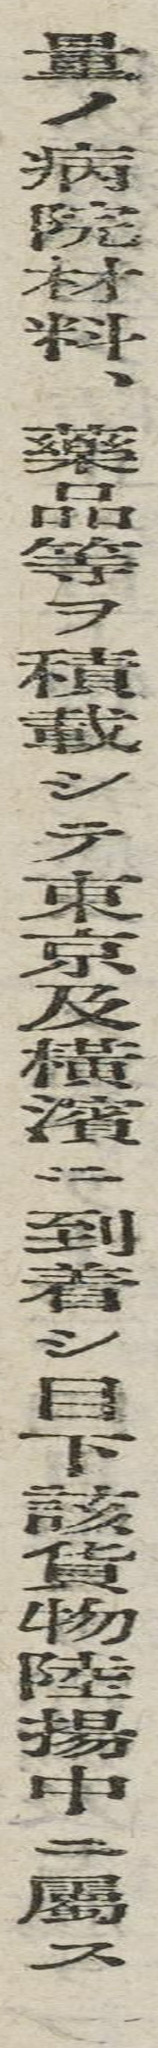量ノ病院材料、薬品等ヲ積載シテ東京及横浜ニ到着シ目下該貨物陸揚中ニ属ス
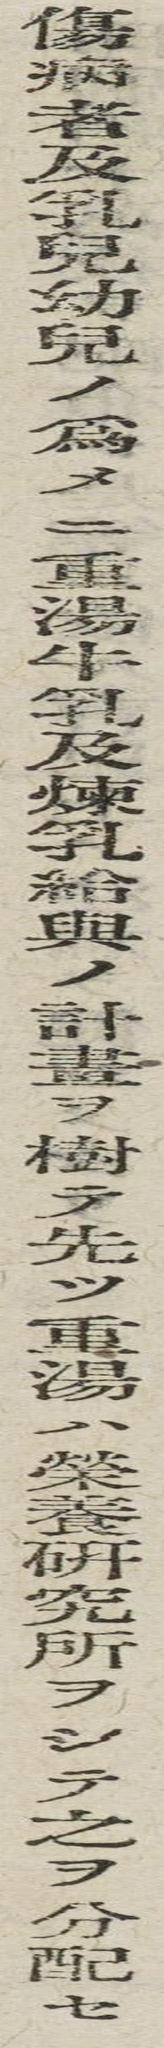傷病者及乳児幼児ノ為メニ重湯牛乳及練乳給与ノ計画ヲ樹テ先ツ重湯ハ栄養研究所ヲシテ之ヲ分配セ
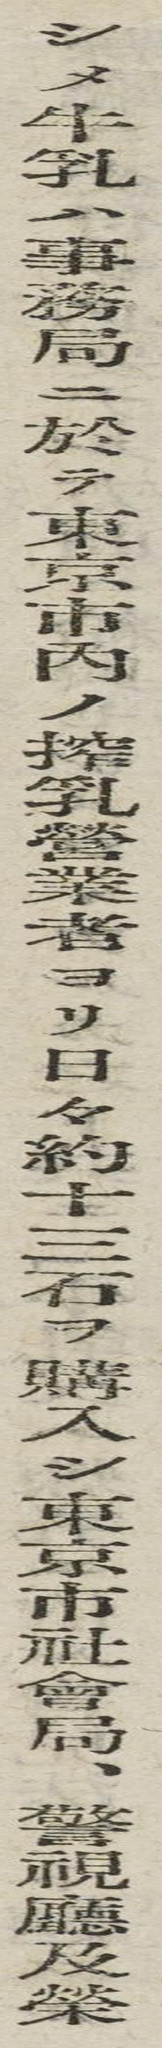シメ牛乳ハ事務局ニ於テ東京市内ノ搾乳営業者ヨリ日々約十三石ヲ購入シ東京市社会局、警視庁及栄
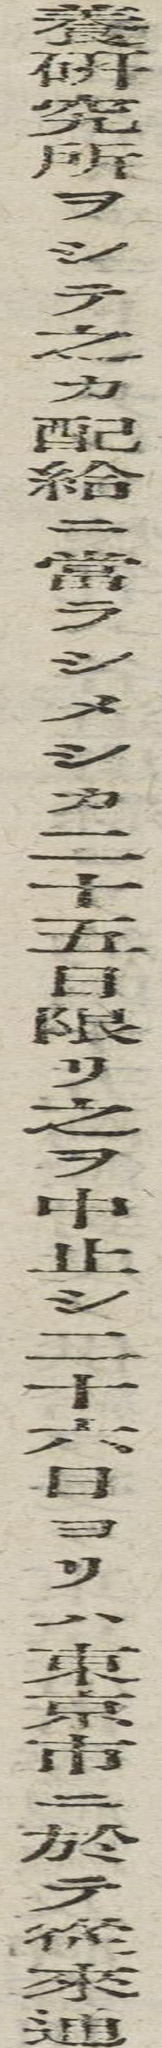養研究所ヲシテ之カ配給ニ当ラシメシカ二十五日限リ之ヲ中止シ二十六日ヨリハ東京市ニ於テ従来通

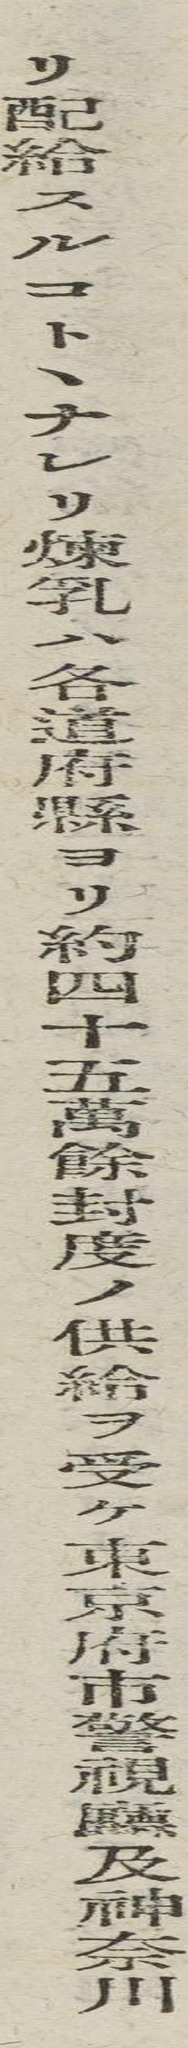リ配給スルコトヽナレリ煉乳ハ各道府県ヨリ約四十五万余封度ノ供給ヲ受ケ東京府市警視庁及神奈川
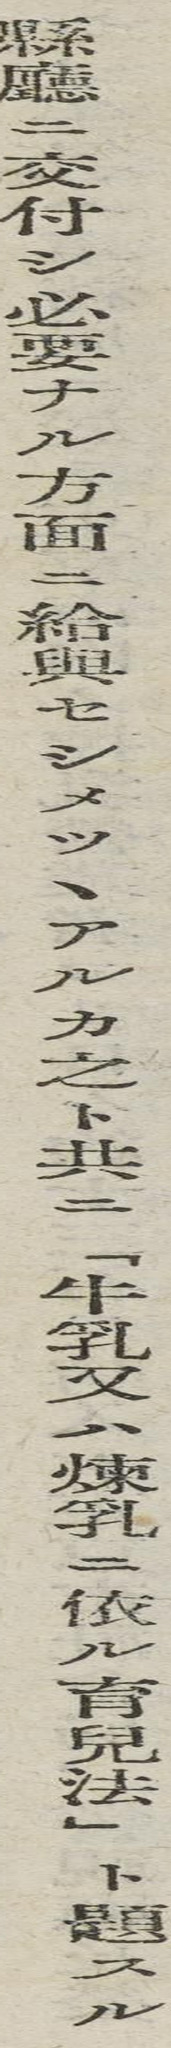県庁ニ交付シ必要ナル方面ニ給与セシメツヽアルカ之ト共ニ「牛乳又ハ煉乳ニ依ル育児法」ト題スル
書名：震災被害状況並救護施設概要
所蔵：東京大学地震研究所図書室 Earthquake Research Institute Library, The University of Tokyo, JAPAN
